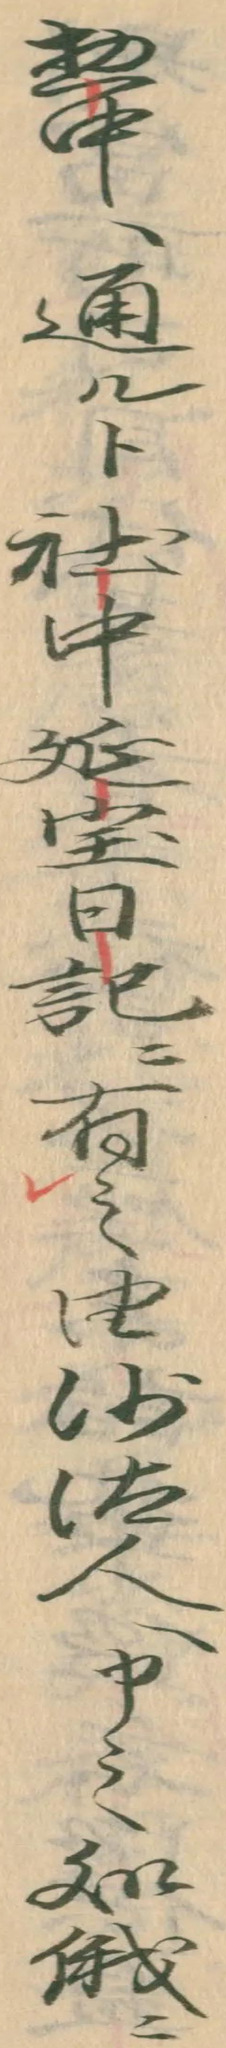惣-中へ通ルト社-中延-宝日-記ニ有之由沙汰人へ申之処俄ニ
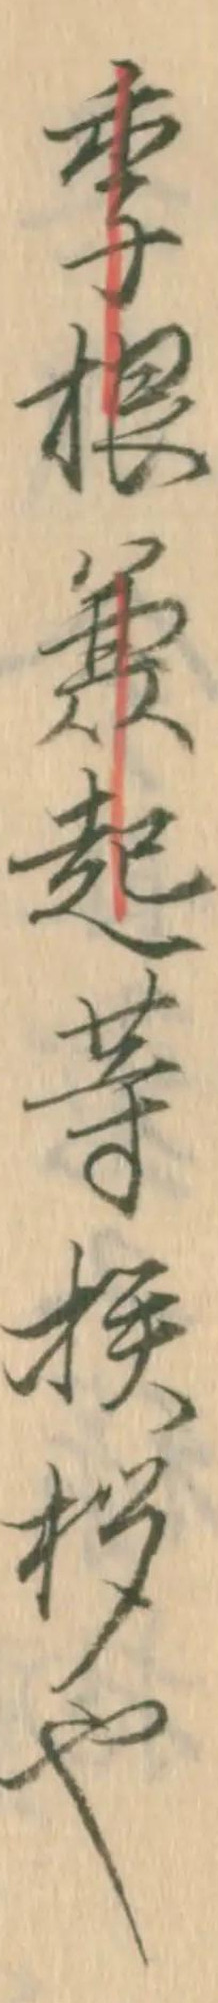季根廉起等挨拶也

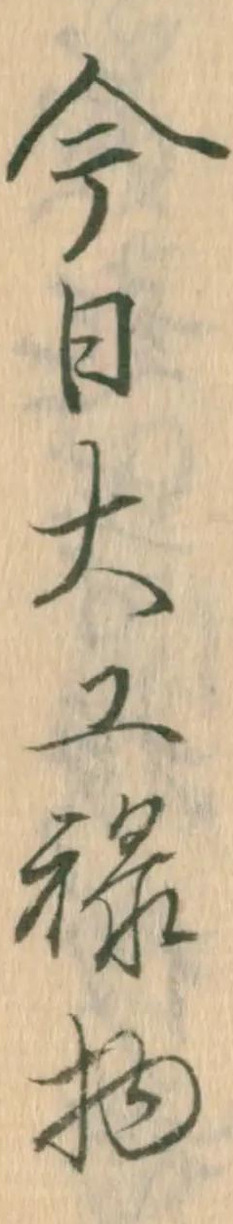今日大工禄物
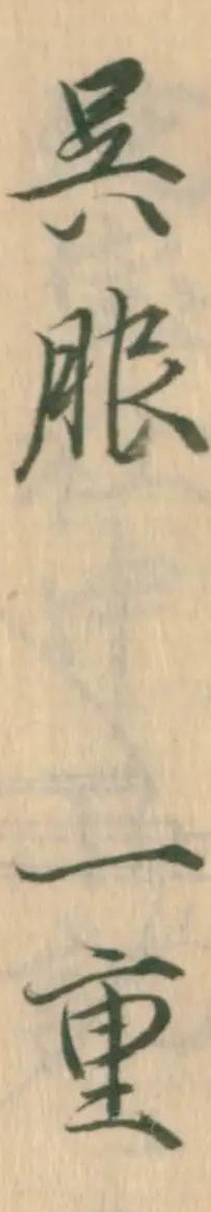呉服一重
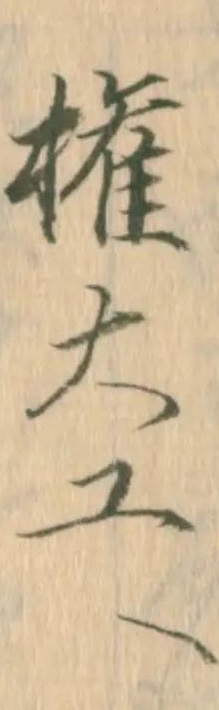権大工ヘ
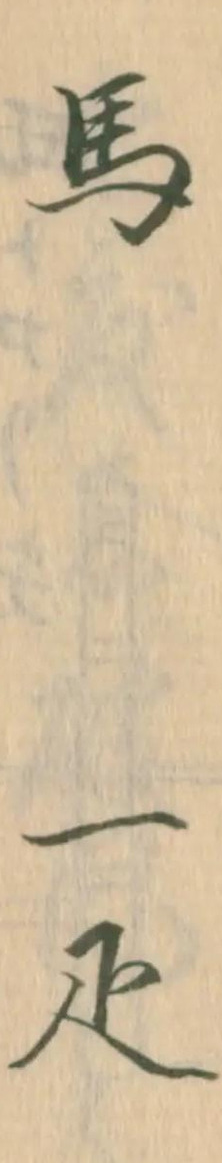馬一疋
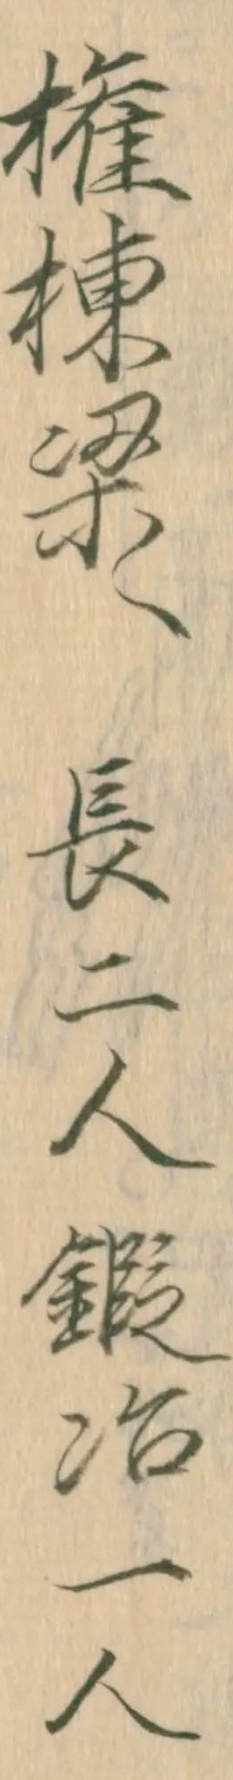権棟梁ヘ長二人鍛冶一人
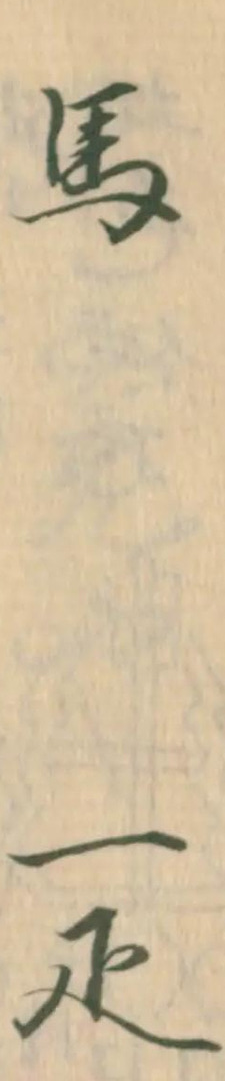馬一疋
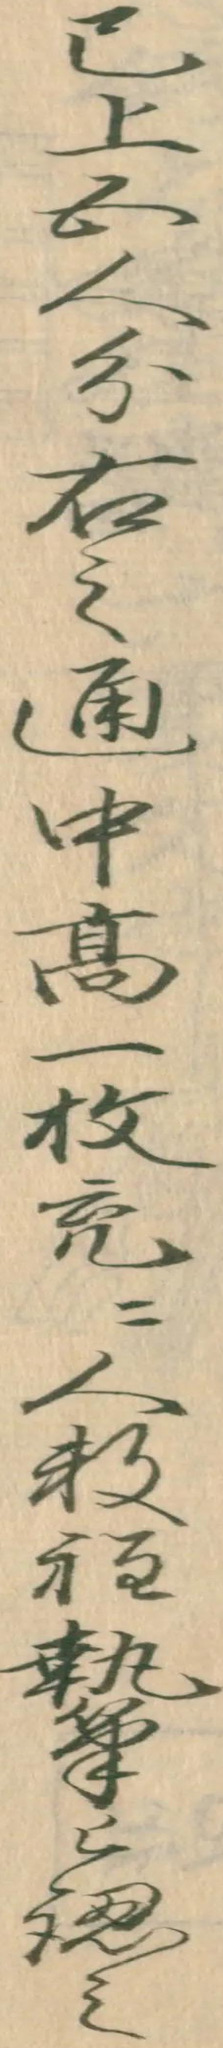已上五人分右之通中高一枚充ニ人数程執筆被認之
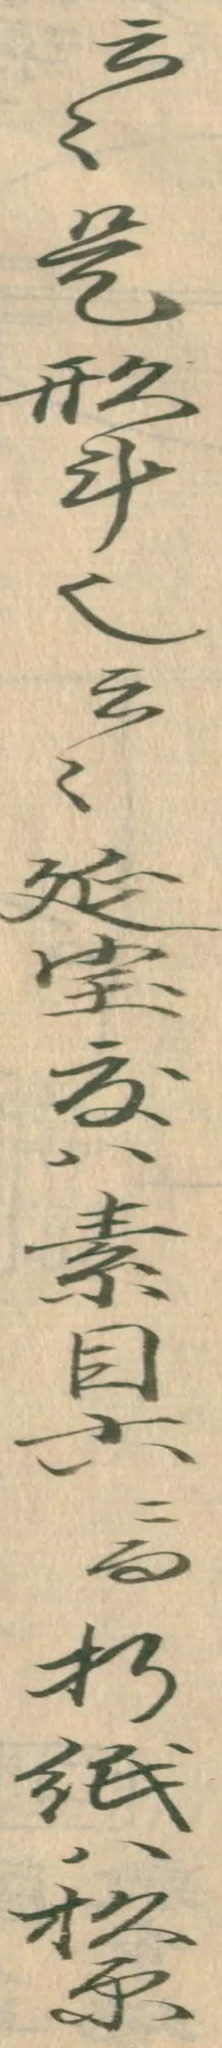云々是形計也云々延宝度ハ素目六ニ而折紙ハ杦原
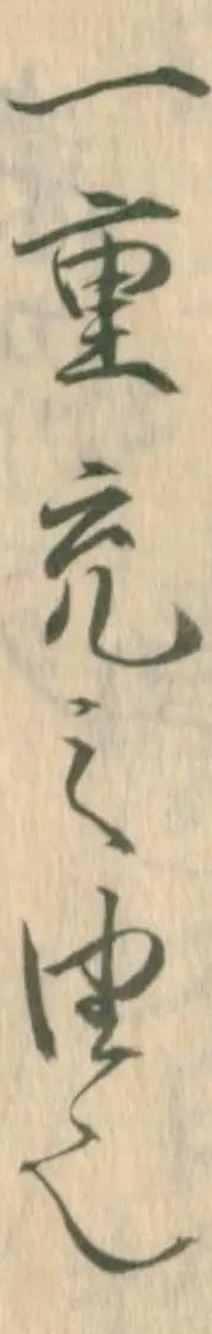一重充之由也
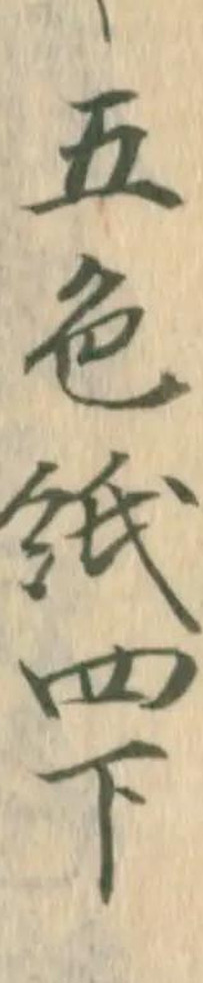五色紙四下

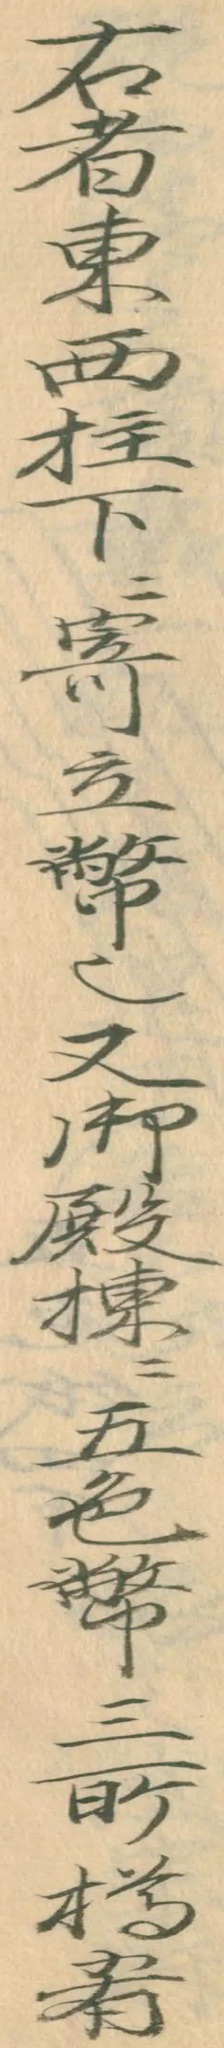右者東西柱下ニ寄立幣也又御殿棟ニ五色幣三所樽肴
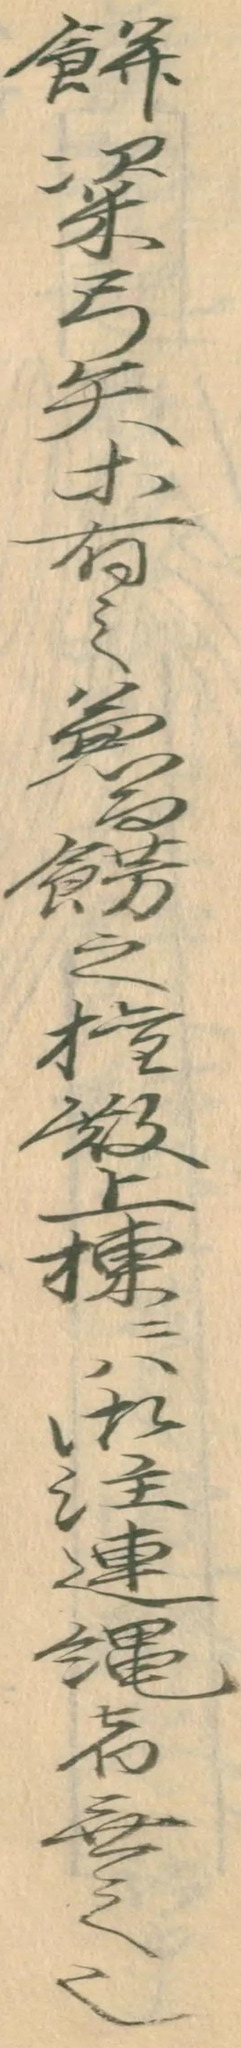餅粢弓矢等有之兼而餝之権殿上棟ニハ御注連縄者無之也
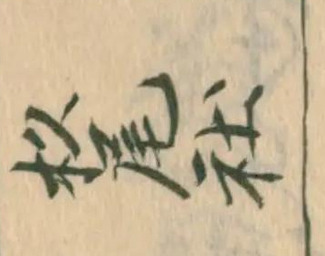松尾社
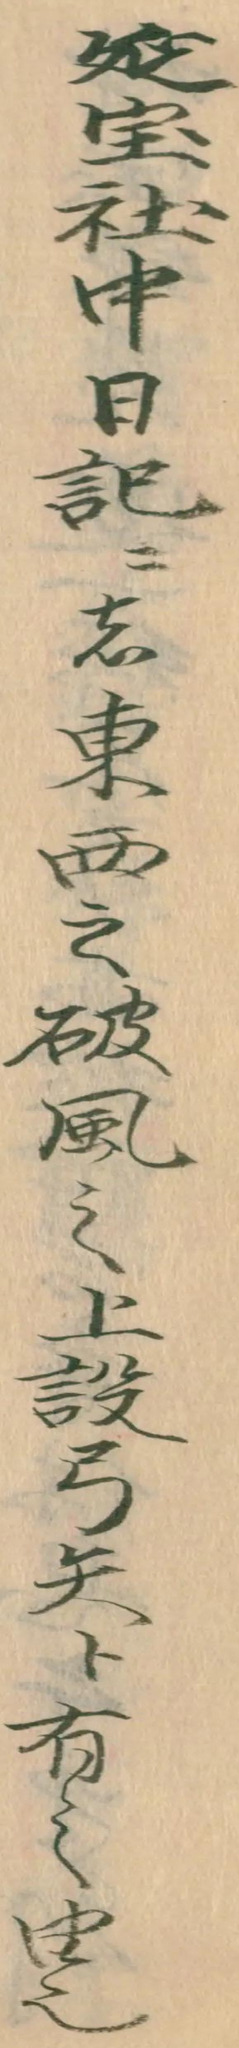延宝社中日記ニ者東西之破風之上設弓矢ト有之由也
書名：賀茂社記録. 第15冊
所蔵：国立国会図書館 National Diet Library, JAPAN
